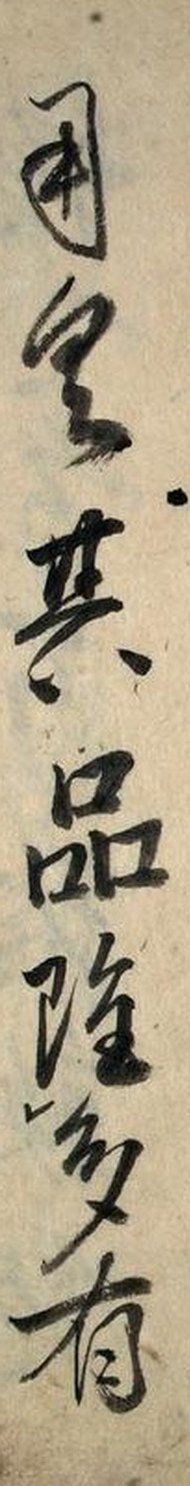用具其品雖多有

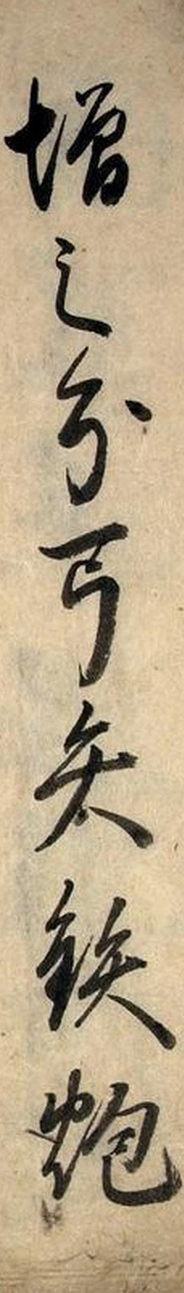増之分弓矢鉄炮
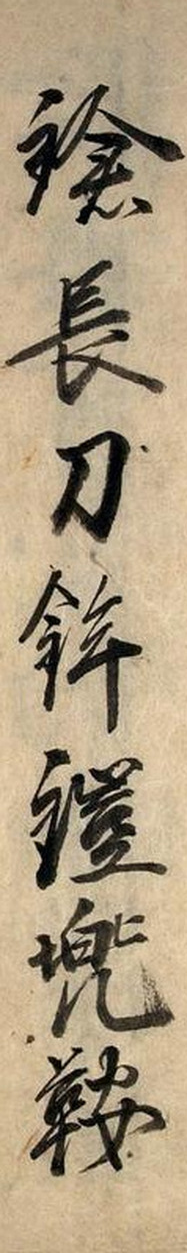鎗長刀鉾鎧兜鞍
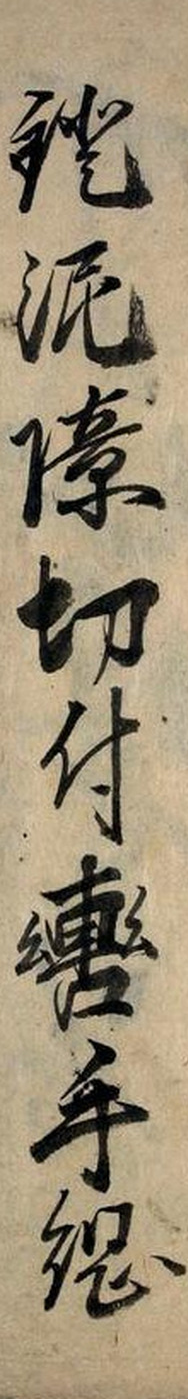鐙泥障切付轡手綱
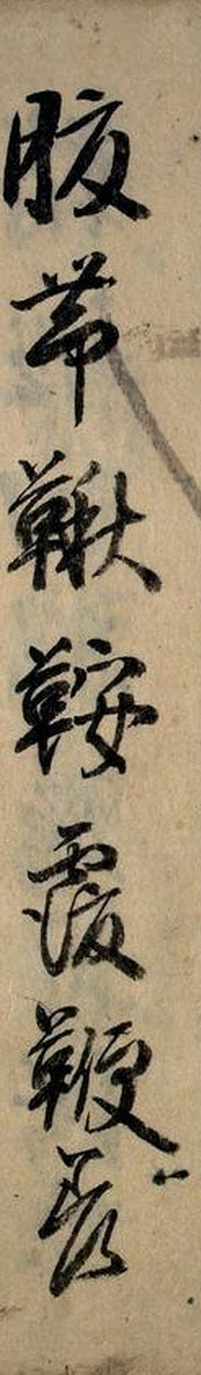腹帯鞦鞍覆鞭差
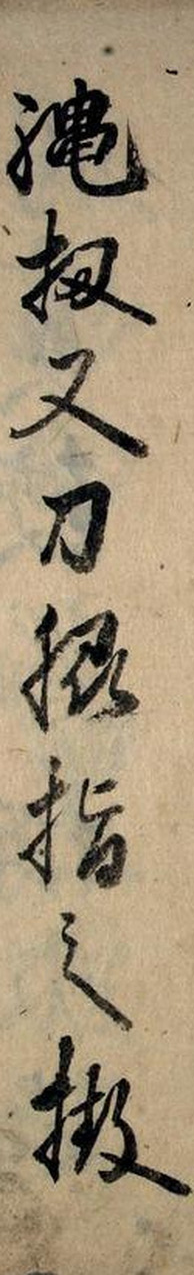縄扨又刀脇指之扱

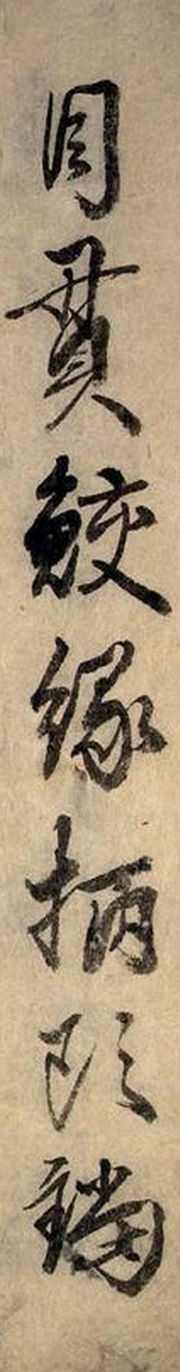目貫鮫縁柄頭͡鐺
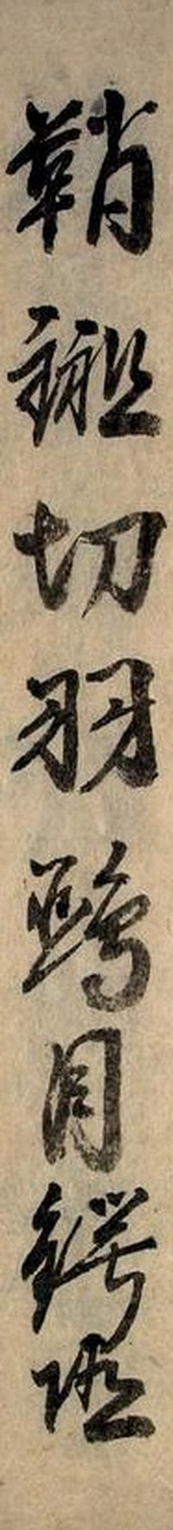鞘鍛切羽鵐目鍔陏
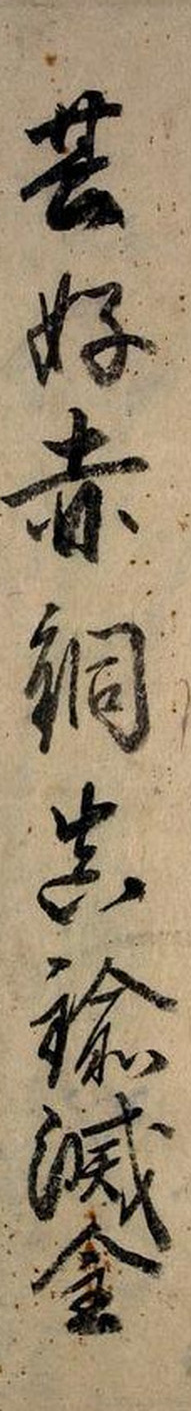芸好赤銅真鍮滅金
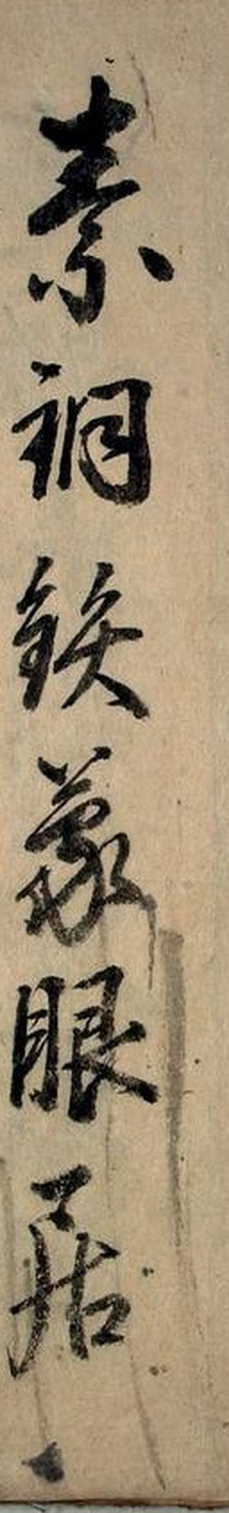素銅鉄蒙眼居
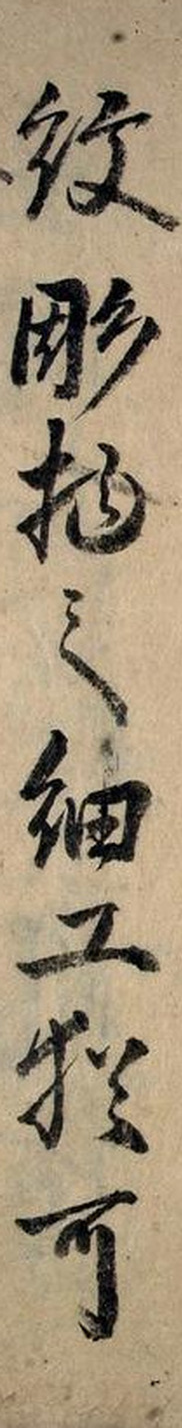紋彫物之細工猶可

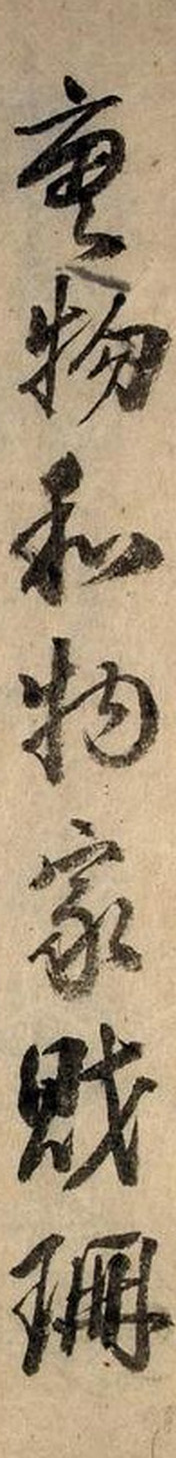唐物和物家財珊
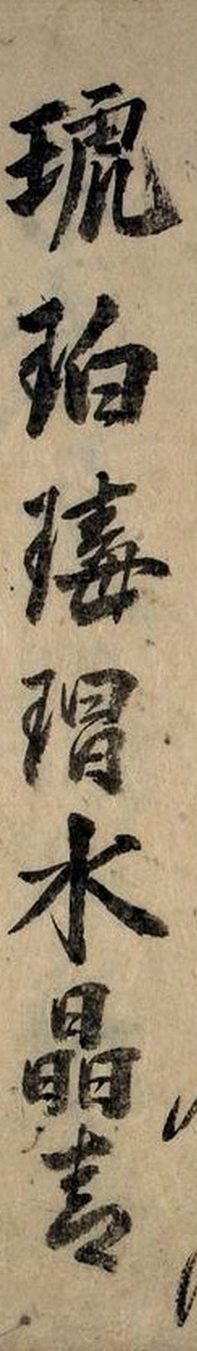琥珀瑇瑁水晶青
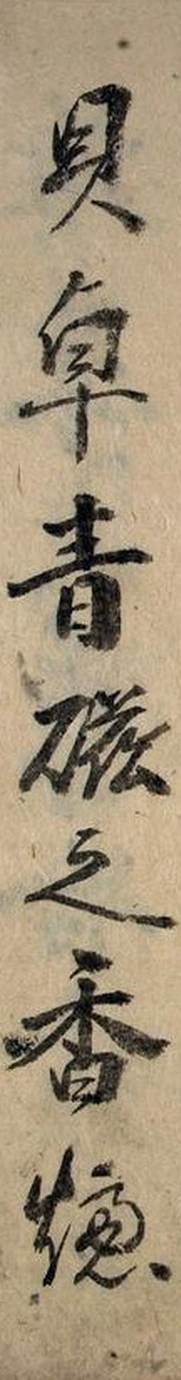貝卓青磁之香炉爐

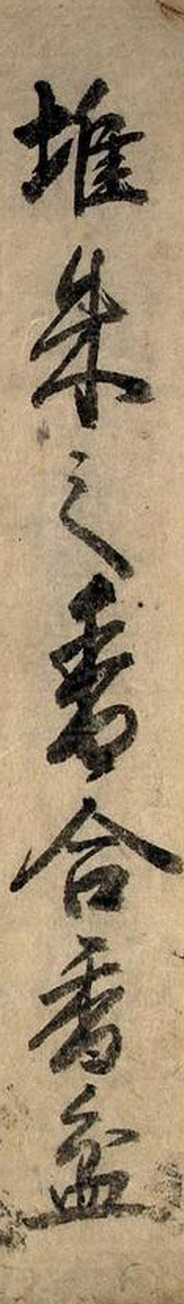堆朱之香合香盃
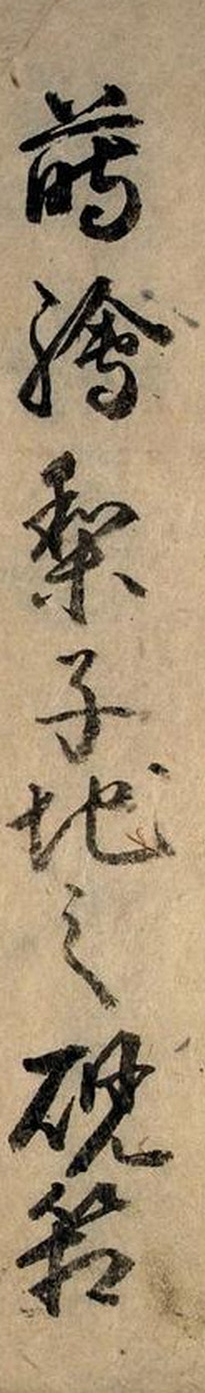蒔絵梨子地之硯箱
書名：商売往来（往来物、手習）
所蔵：福井県文書館 Fukui Prefectural Archives
